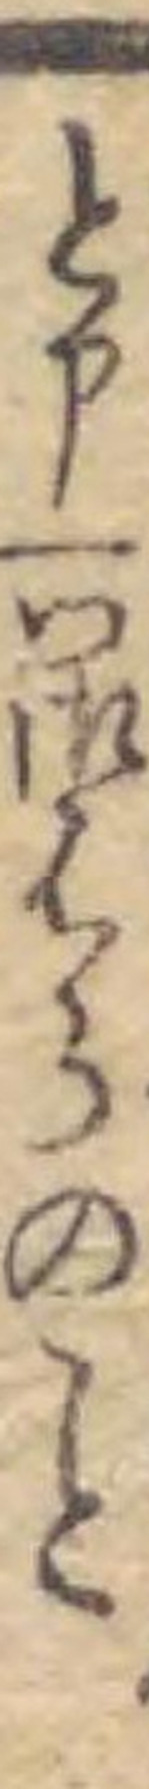と申一ツ御はらのこと
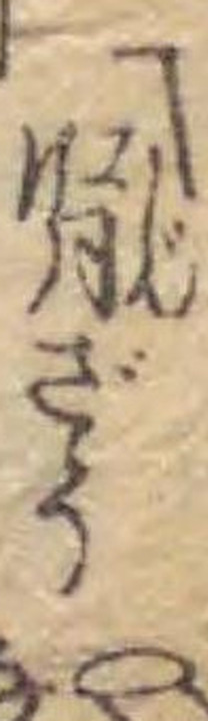〽腎ざう
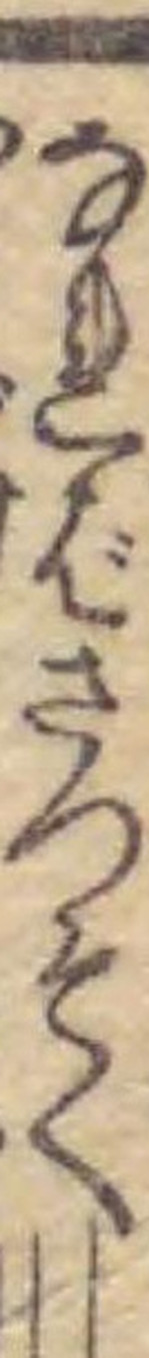なればさつそく
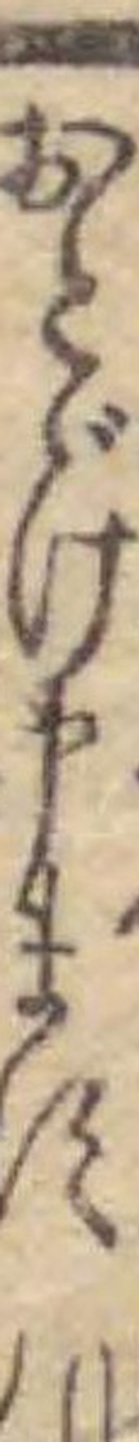おとゞけ申ます
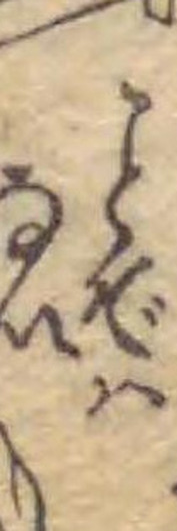ことでは
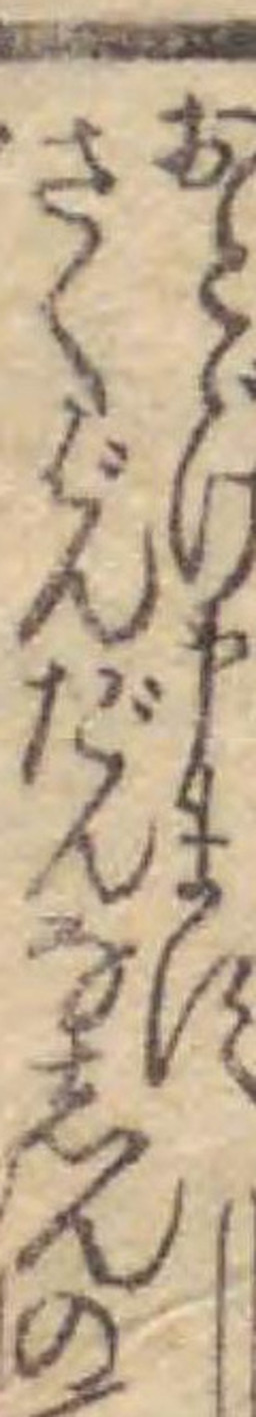さくばんだんなしんの
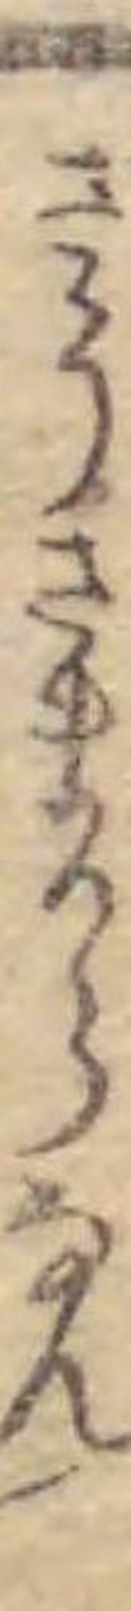ざうさまからなん
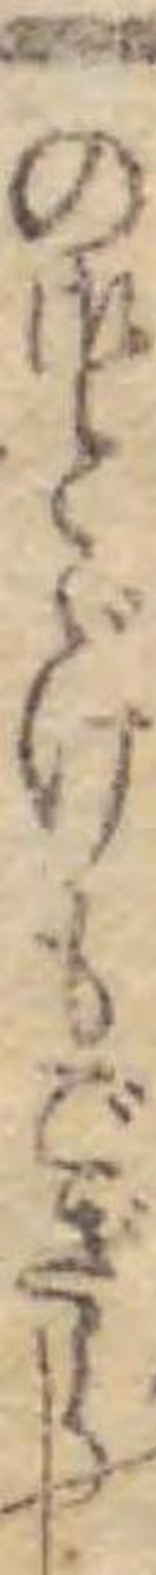の御とゞけもござら
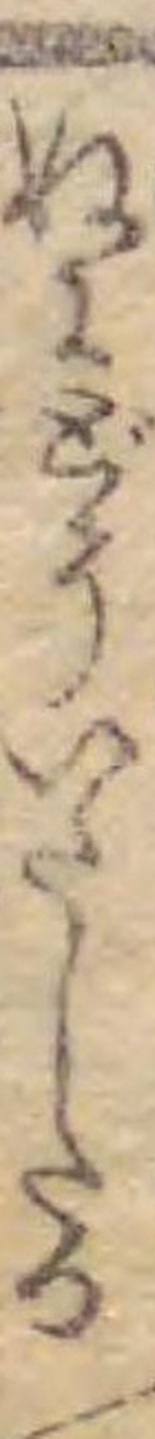ぬにどういたしたる
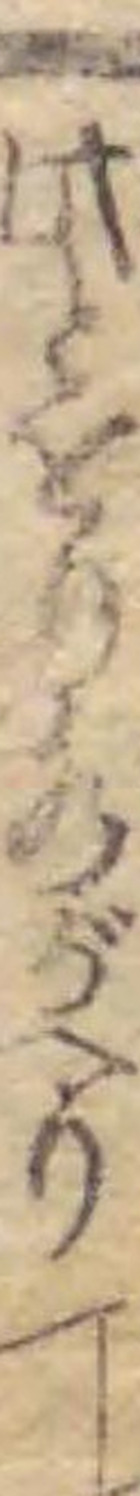此とをり水がへり
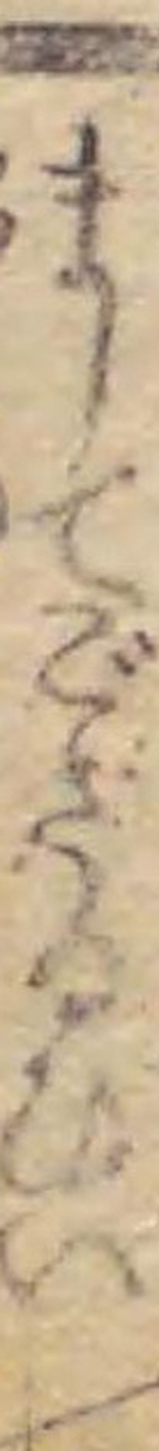ましてござるひい
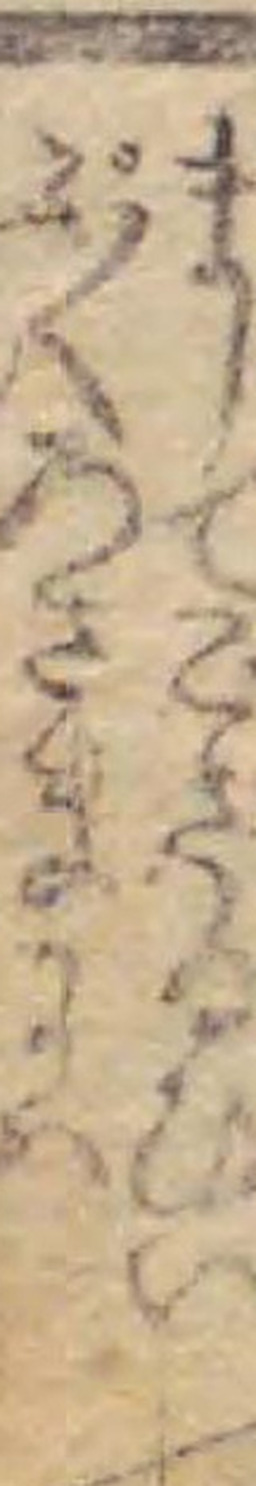ぶ〱ろさまには
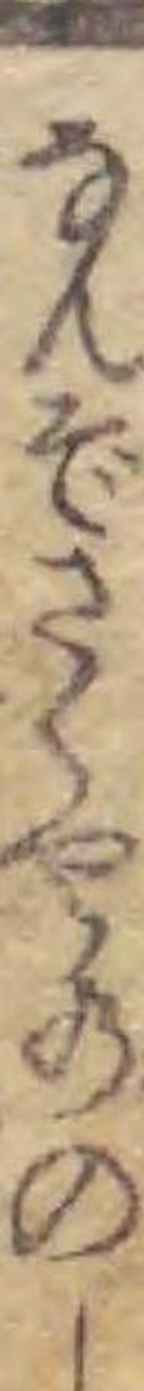なんぞさくや水の
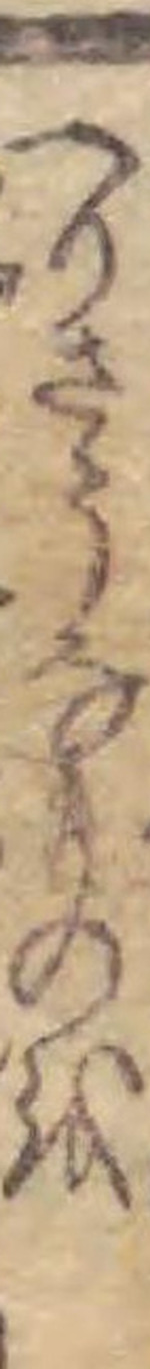へりさうなものを
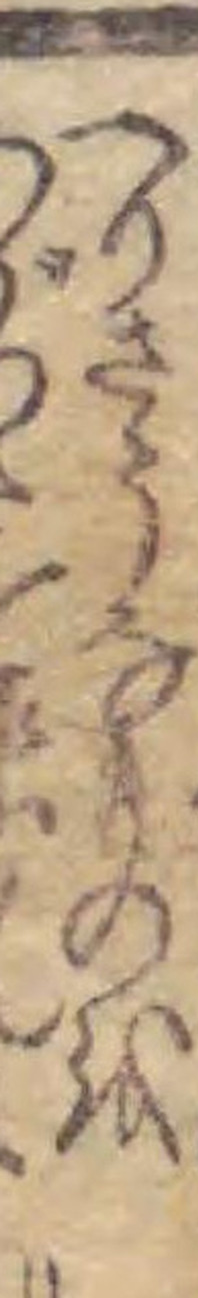へりさうなものを
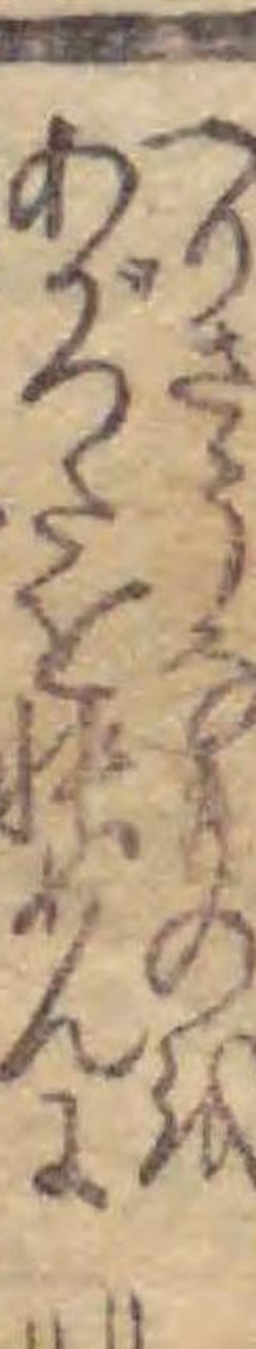あがつたを帳めんに
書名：十四傾城腹之内 : 3巻
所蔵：国立国会図書館 National Diet Library, JAPAN
